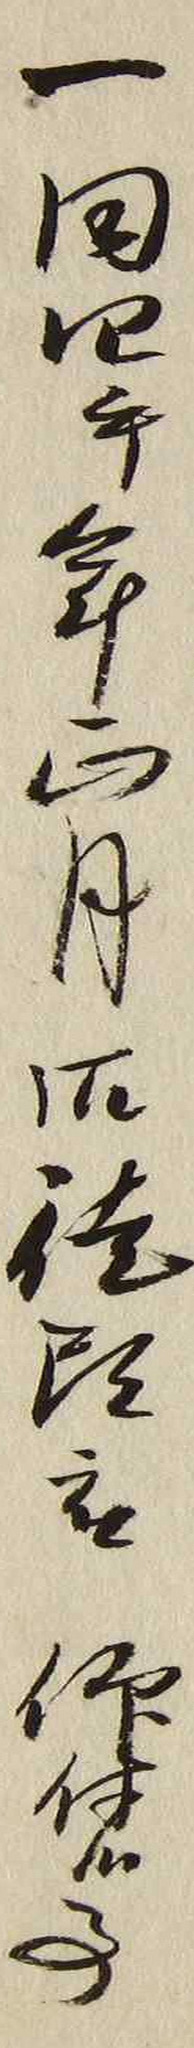一同四午年正月御徒頭被仰付候事

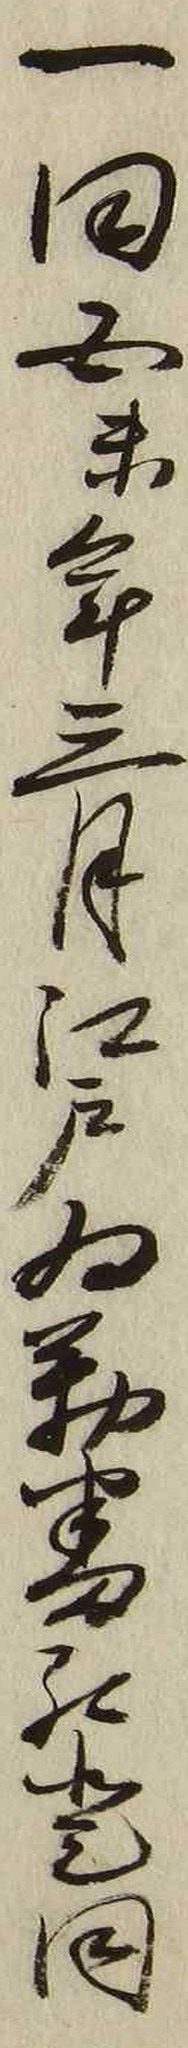一同五未年三月江戸為勤番罷登同
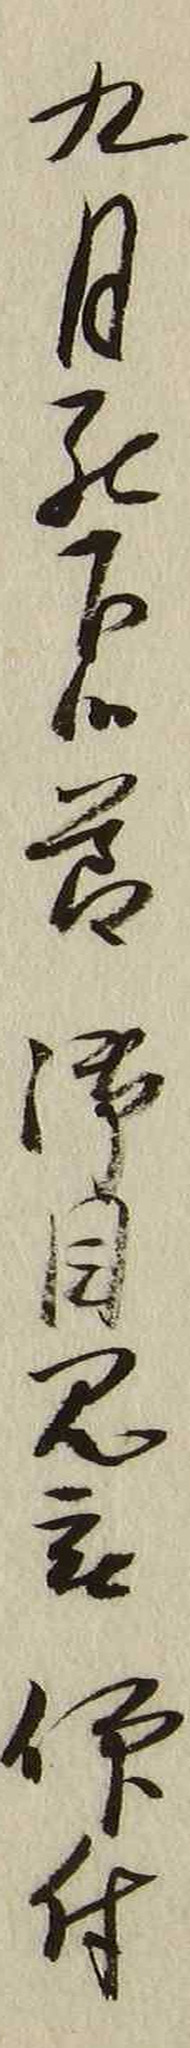九月罷下候節御目見被仰付
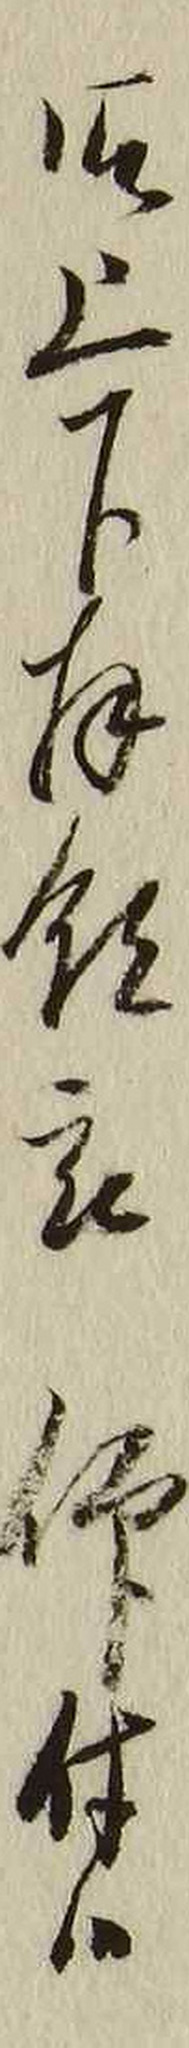御上下拝領被仰付候
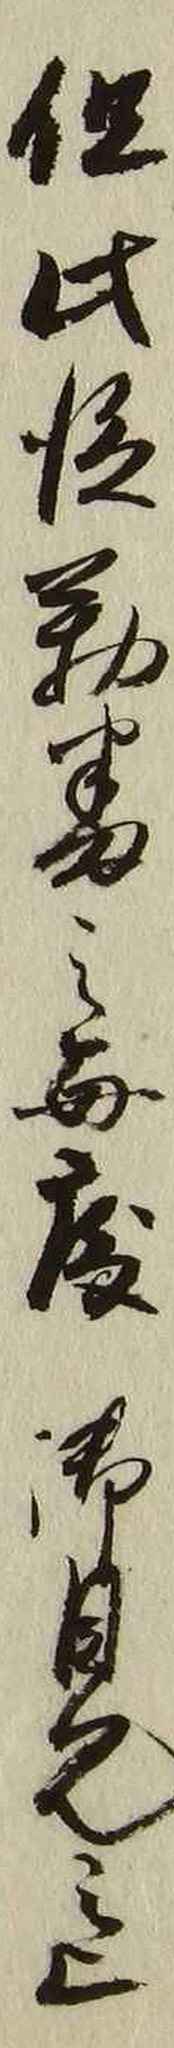但此後勤番之毎度御目見之上
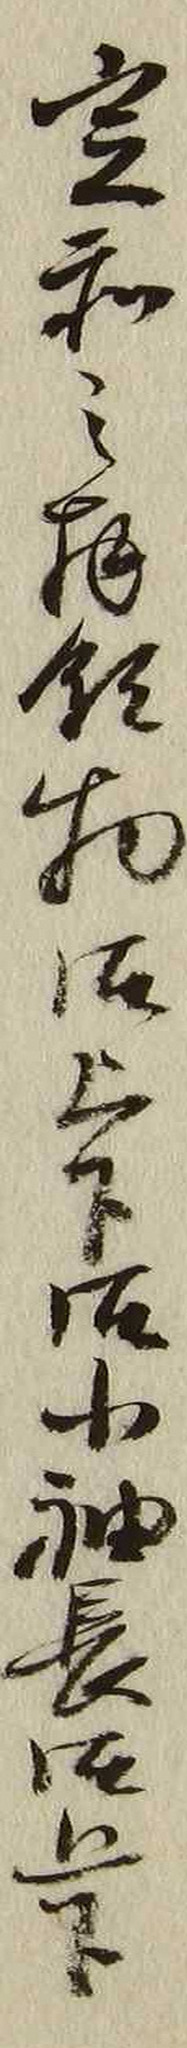定和之拝領物御上下御小袖長御上下
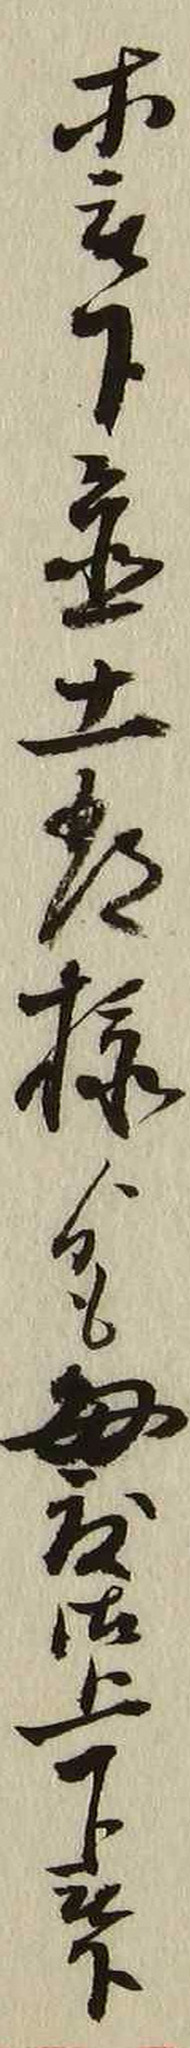等被下置土常様ゟも毎度御上下被下
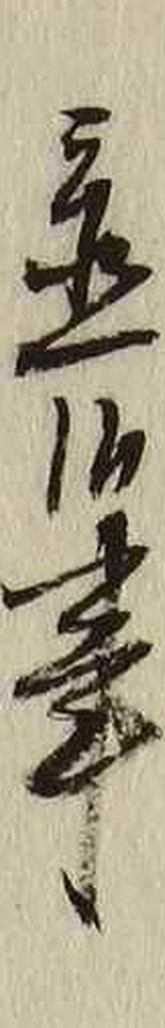置候事
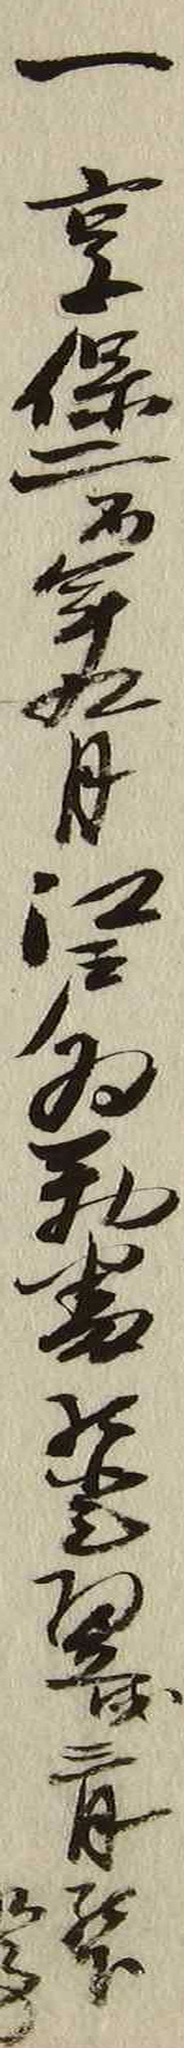一享保二酉年九月江戸為勤番罷登翌戌三月罷下候事
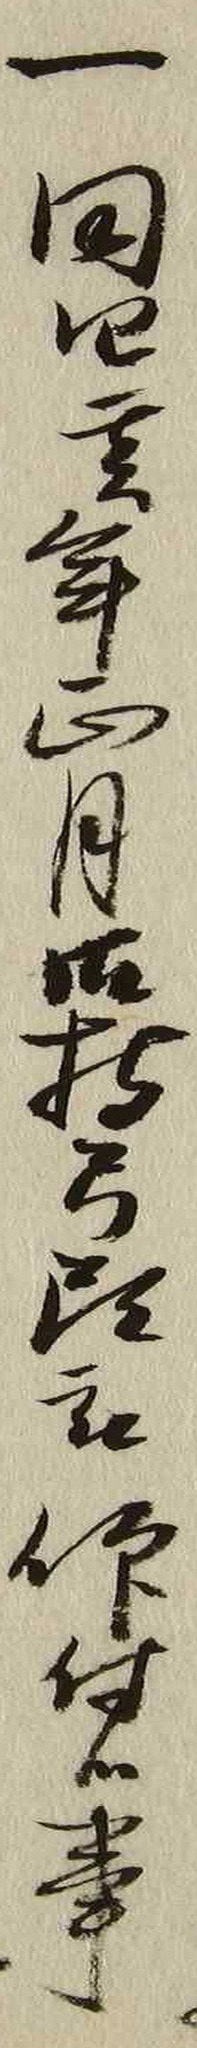一同四亥年正月御持弓頭被仰付候事
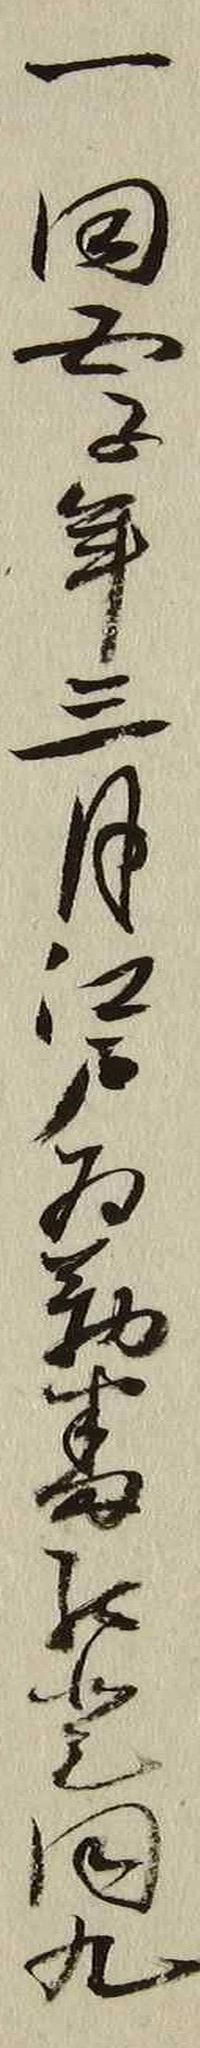一同五子年三月江戸為勤番罷登同九
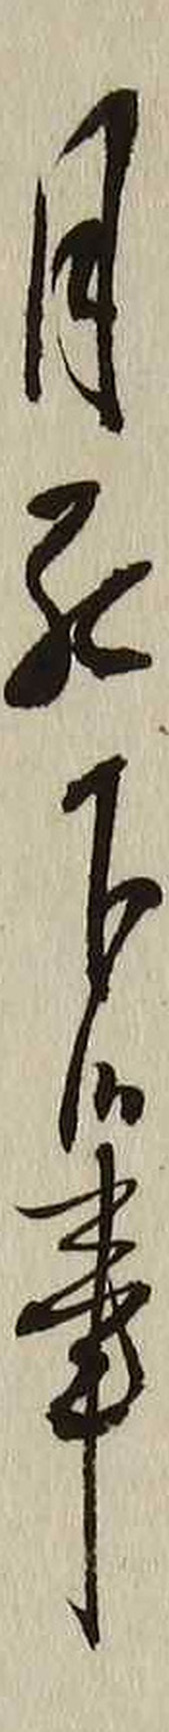月罷下候事
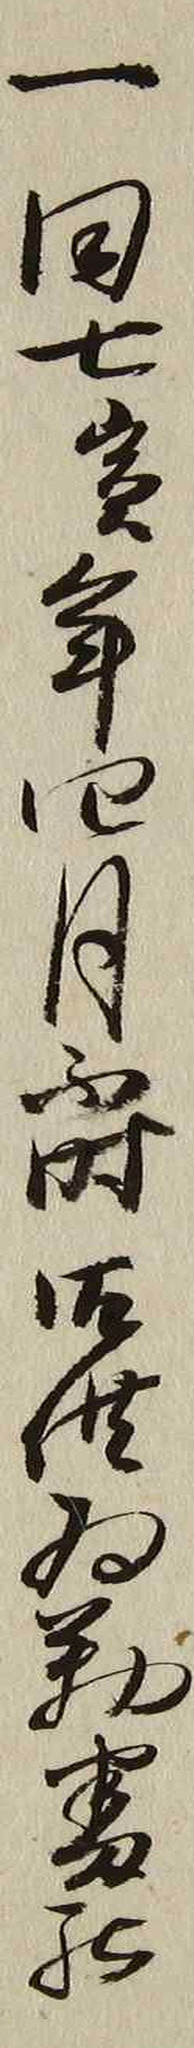一同七寅年四月不時御供為勤番罷
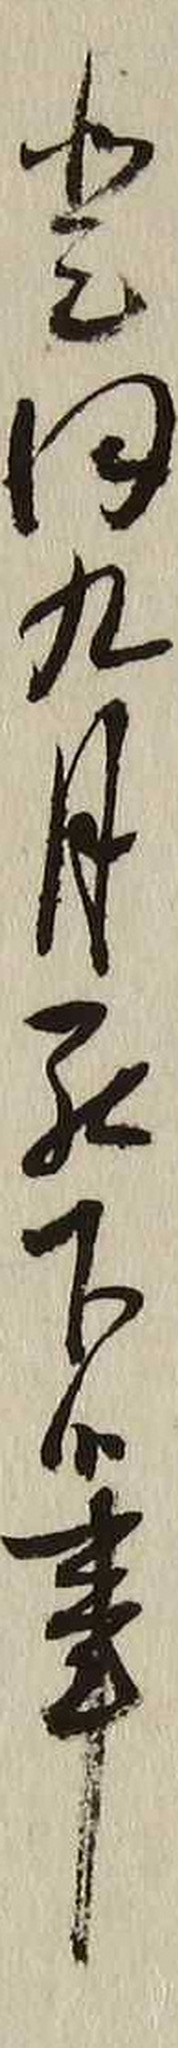登同九月罷下候事
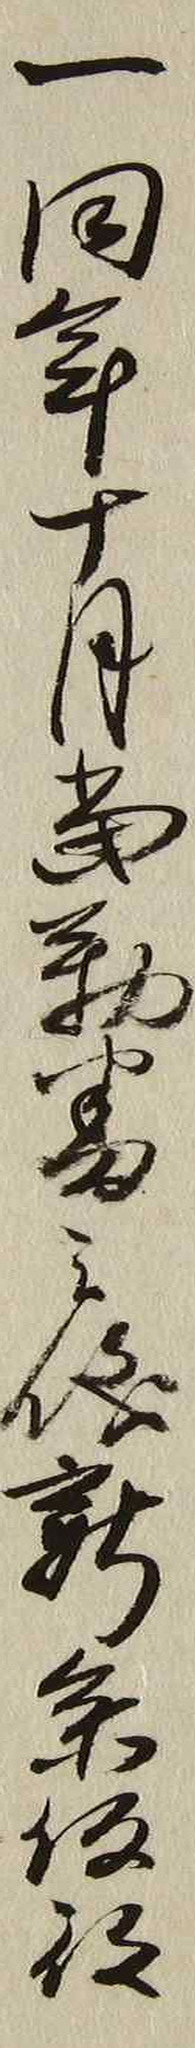一同年十月当勤番之儀新参仮役
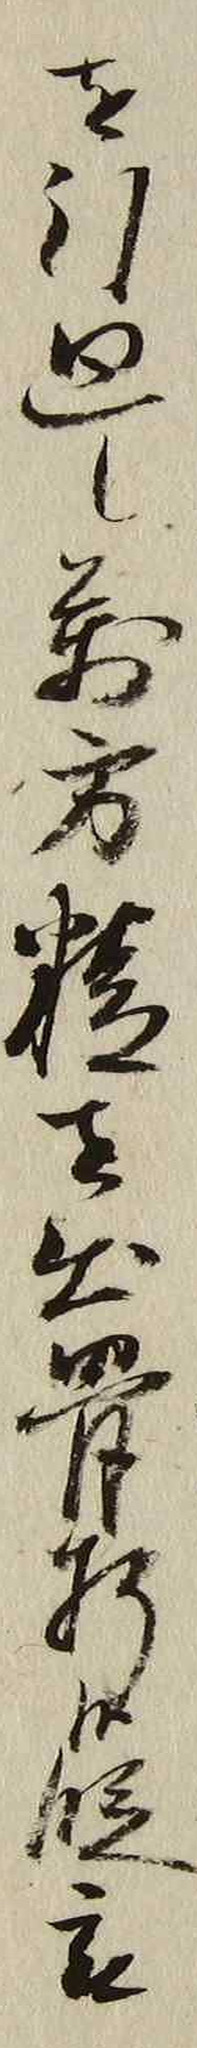を引廻し勤方精を出骨折候段被
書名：諸士系譜　巻之356　す之部6
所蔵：会津若松市立会津図書館
